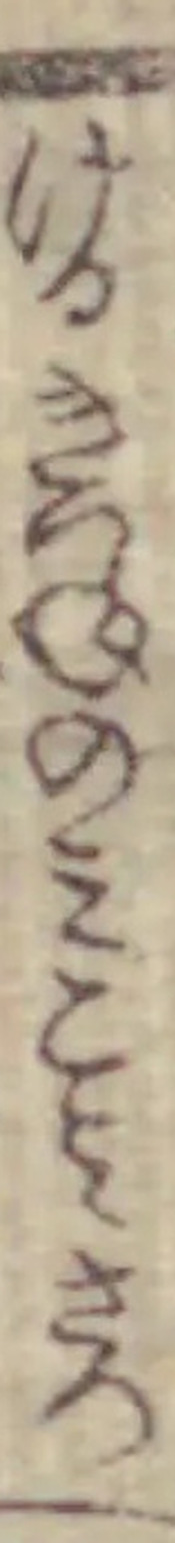けるきつねのみこみさつ
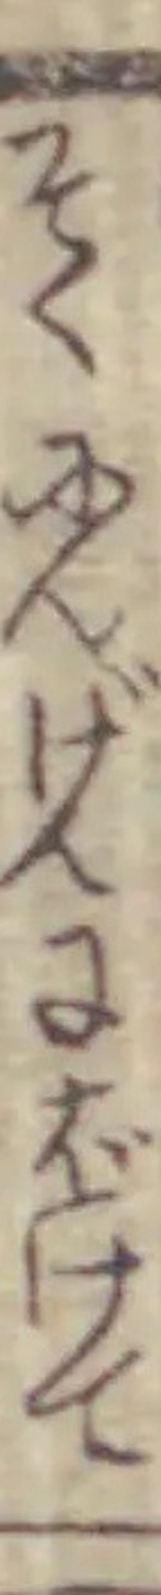そくにんげんにばけて
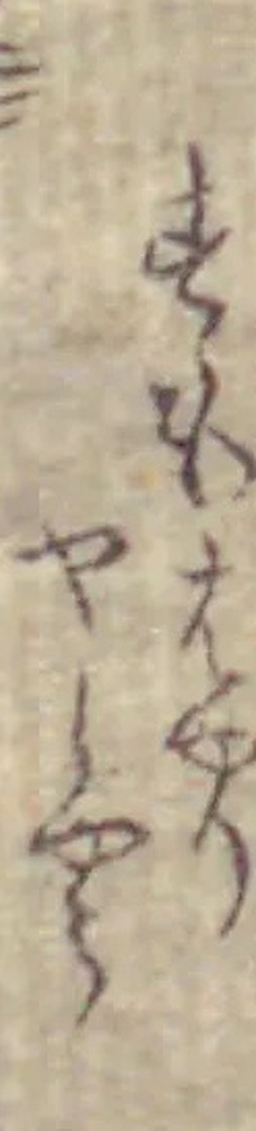やしやう
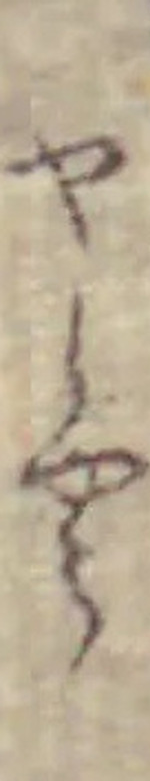やしやう
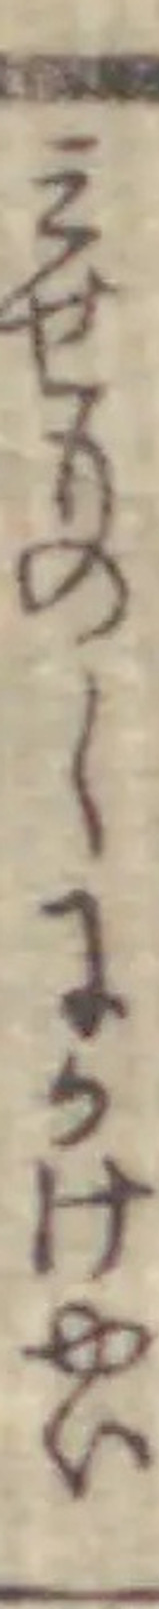みせものしにかけやい
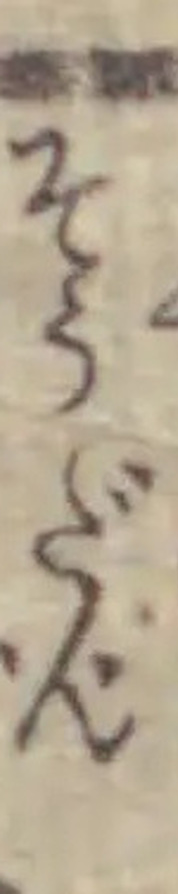そうだん
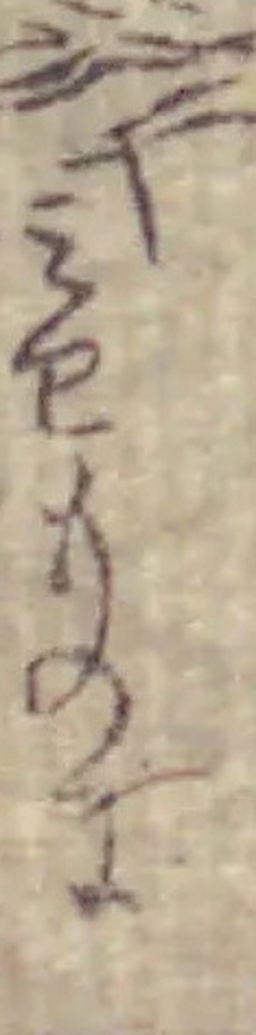〽みせものに
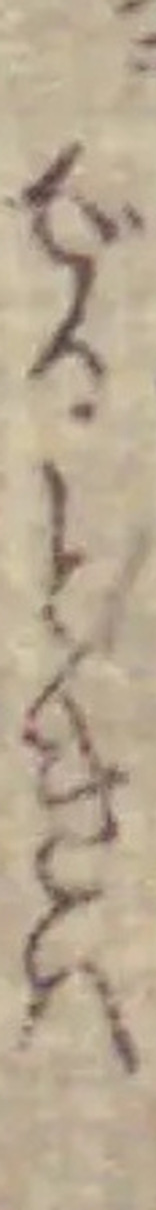でるときは
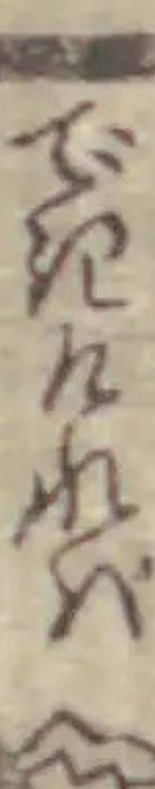できければ
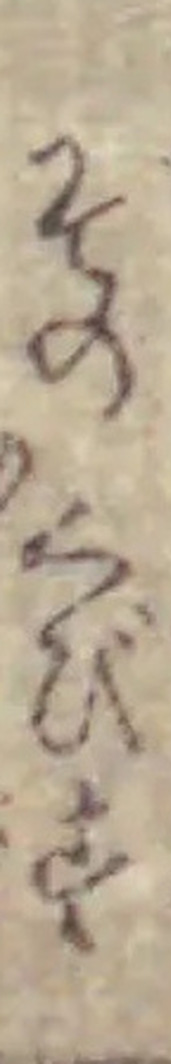そのくびす
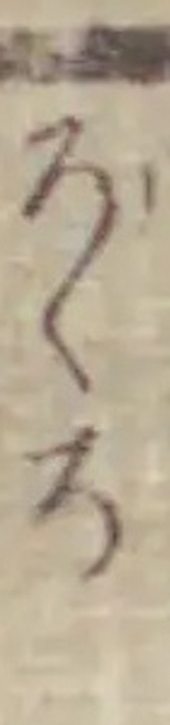ろくろ
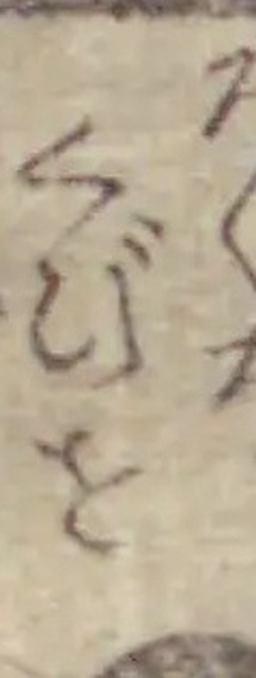くびを
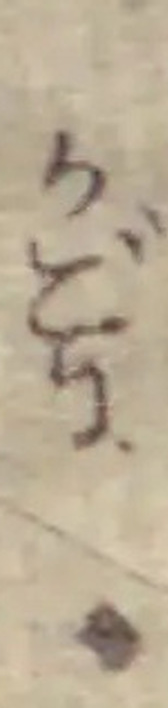かごに
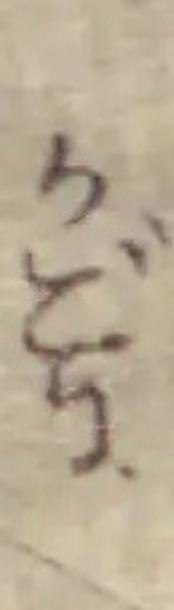かごに
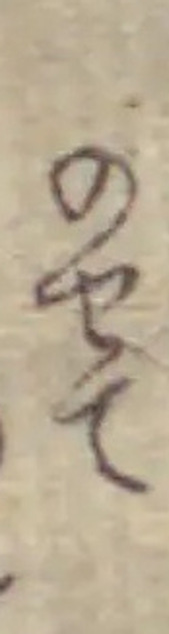のせて
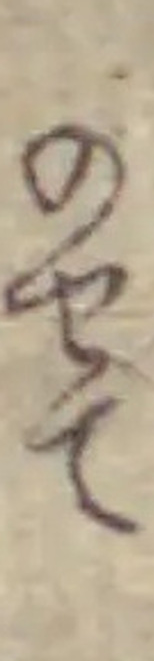のせて
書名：化物敵討 2巻
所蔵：国立国会図書館 National Diet Library, JAPAN
